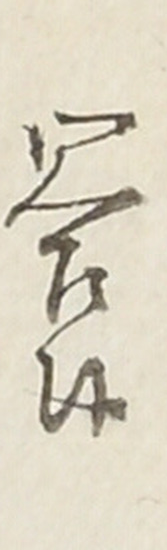思召候
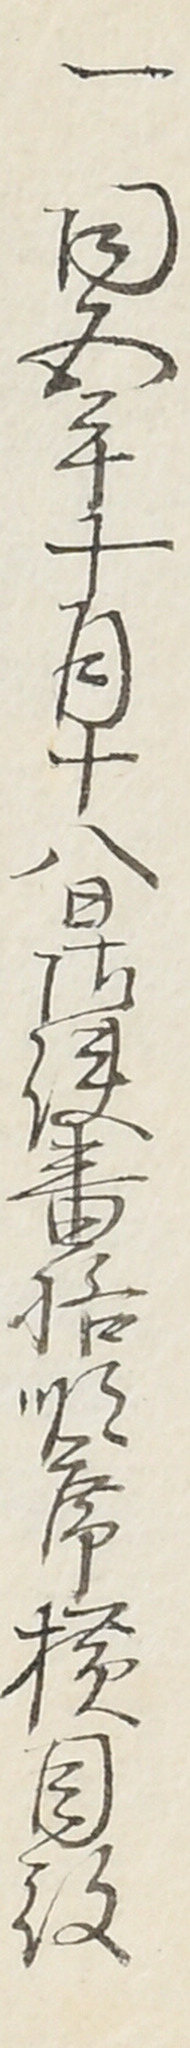一同五午十月十八日御使番格順席横目役
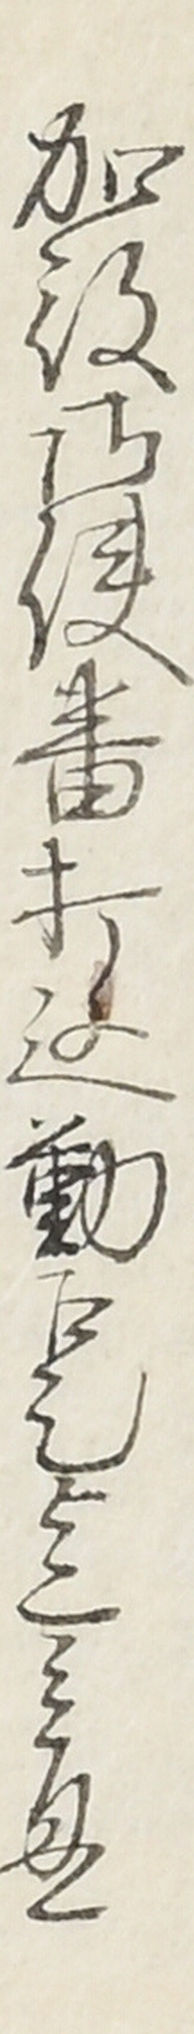加役御使番打込勤是迄之通
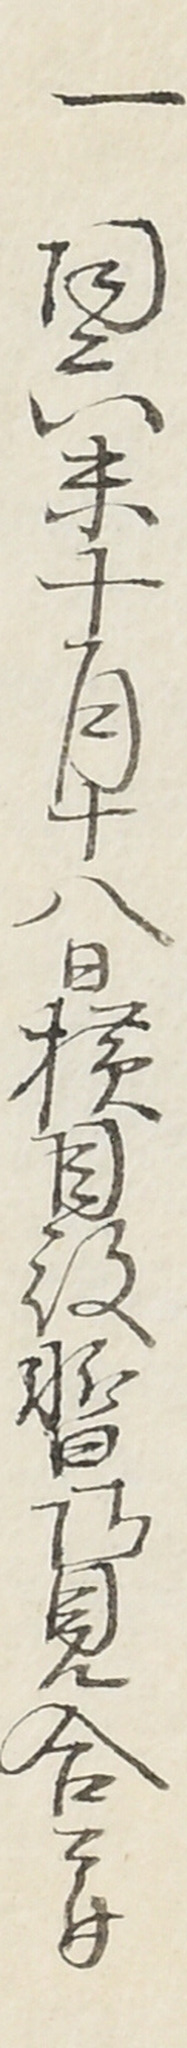同六未十月十八日横目役暫御見合ニ付
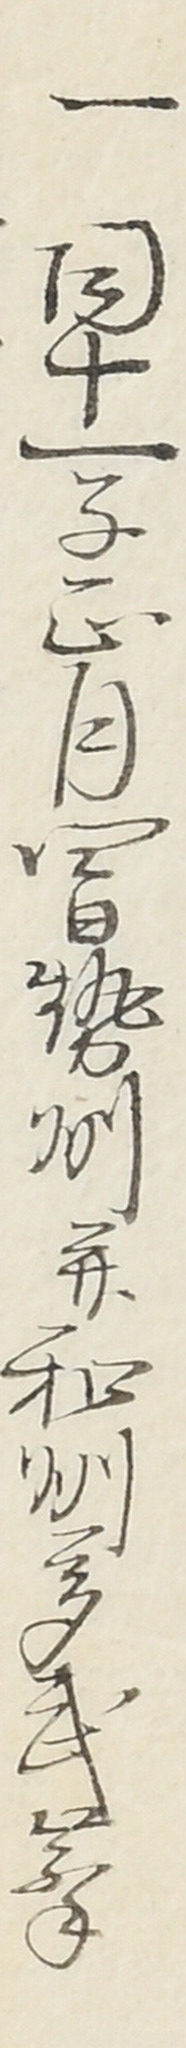一同十一子正月四日勢州并和州多武峰
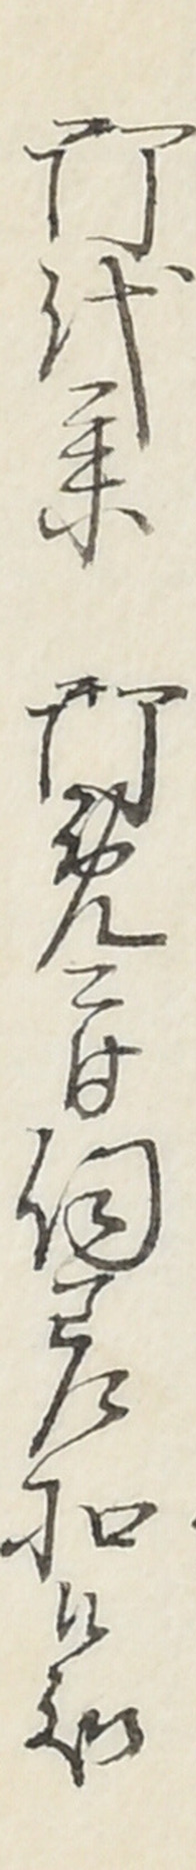御代参御免ニ付伺差控候処
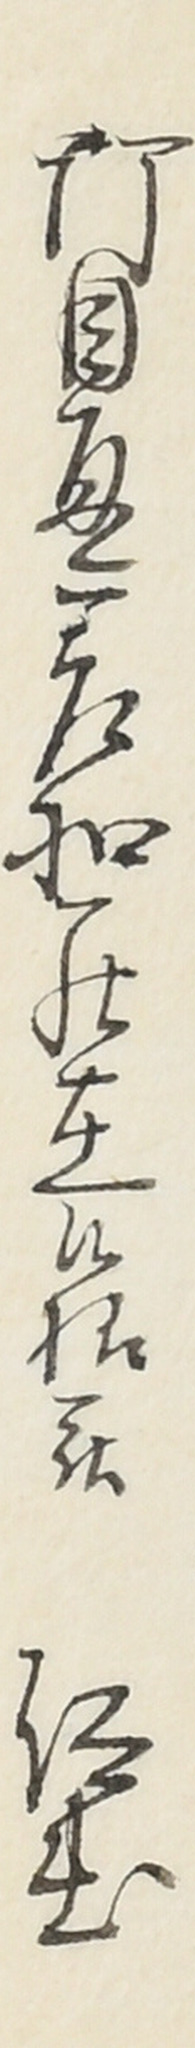御目通差控罷在候様被仰出

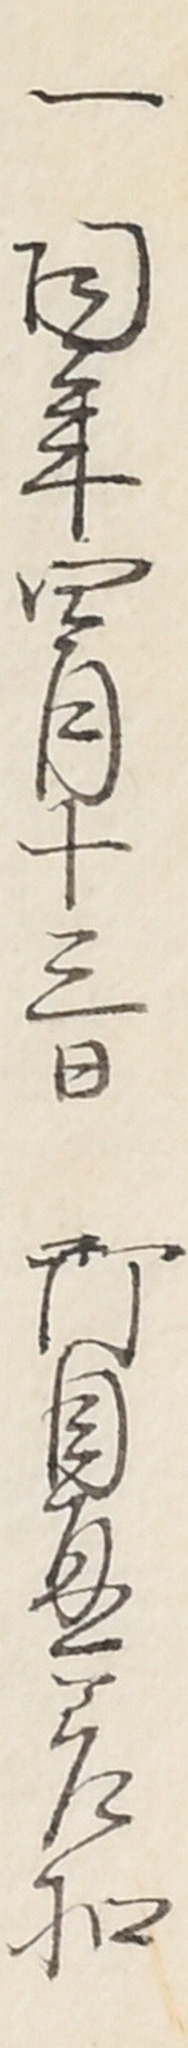一同年四月十三日御目見差控
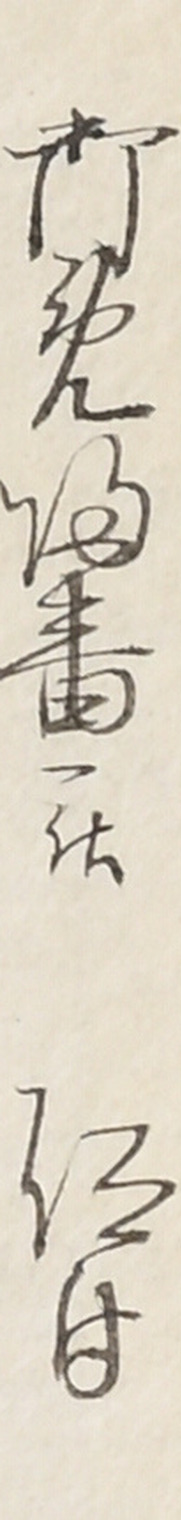御免帰番被仰付
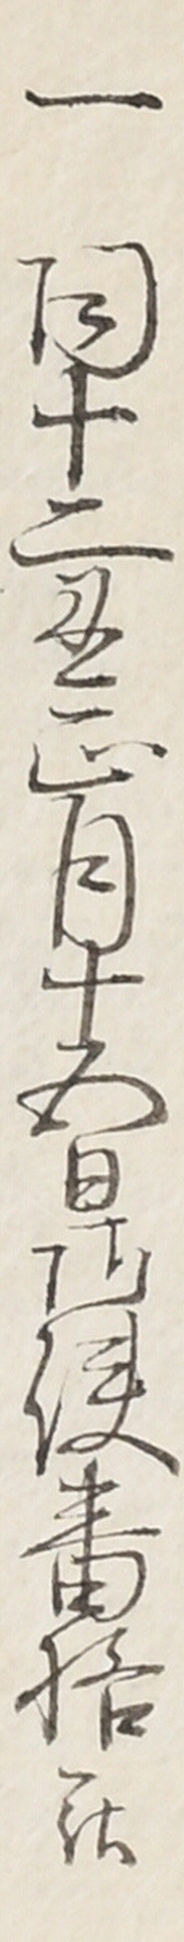一同十二丑正月十五日御使番格被
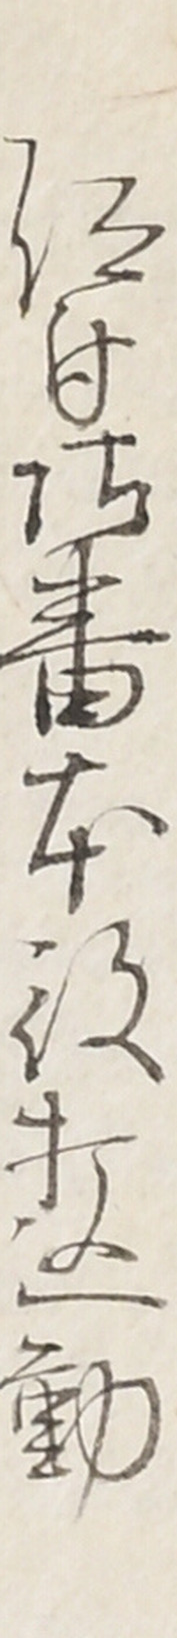仰付御番本役打込勤
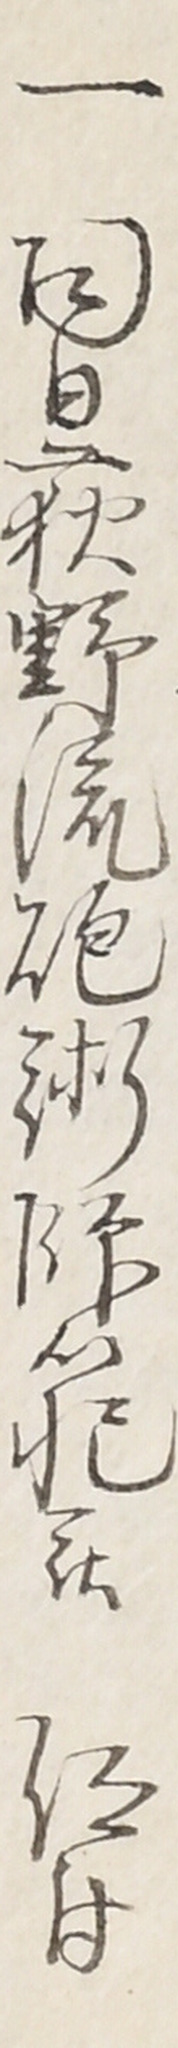一同日荻野流炮術師範被仰付
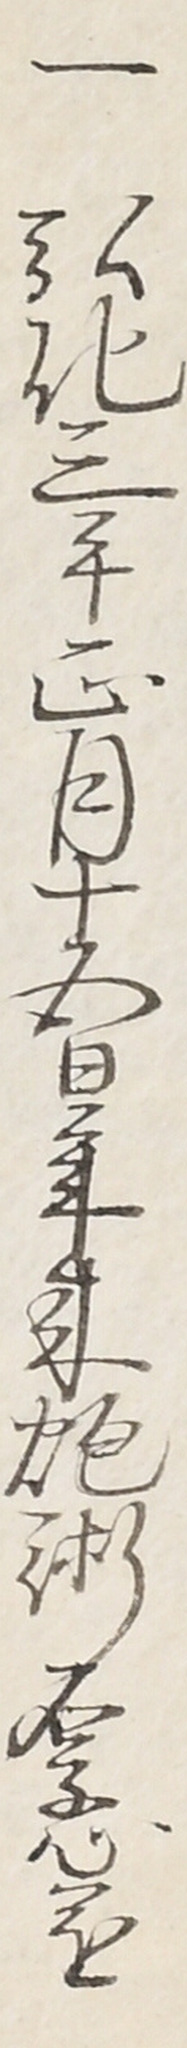一弘化三午正月十五日年来炮術厚心懸
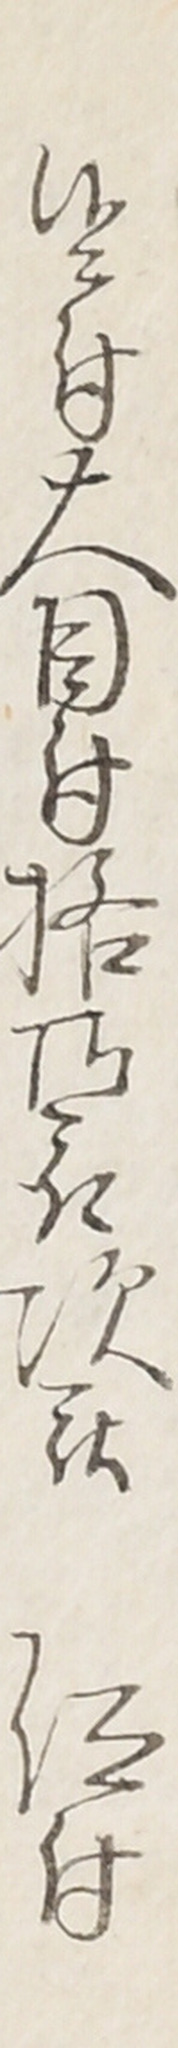候ニ付大目付格御取次被仰付
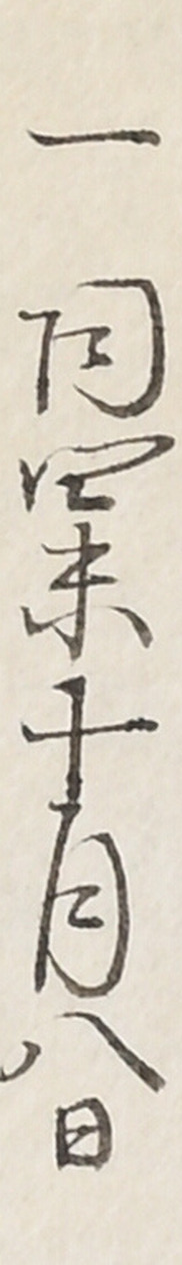一同四未十月八日
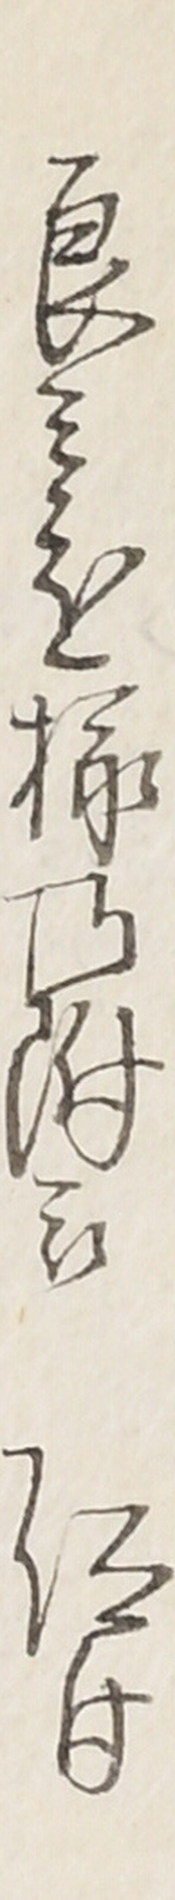良之進様御附被仰付
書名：給人諸士勤仕録（七）
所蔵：伊那市立高遠町図書館・合同会社AMANE
